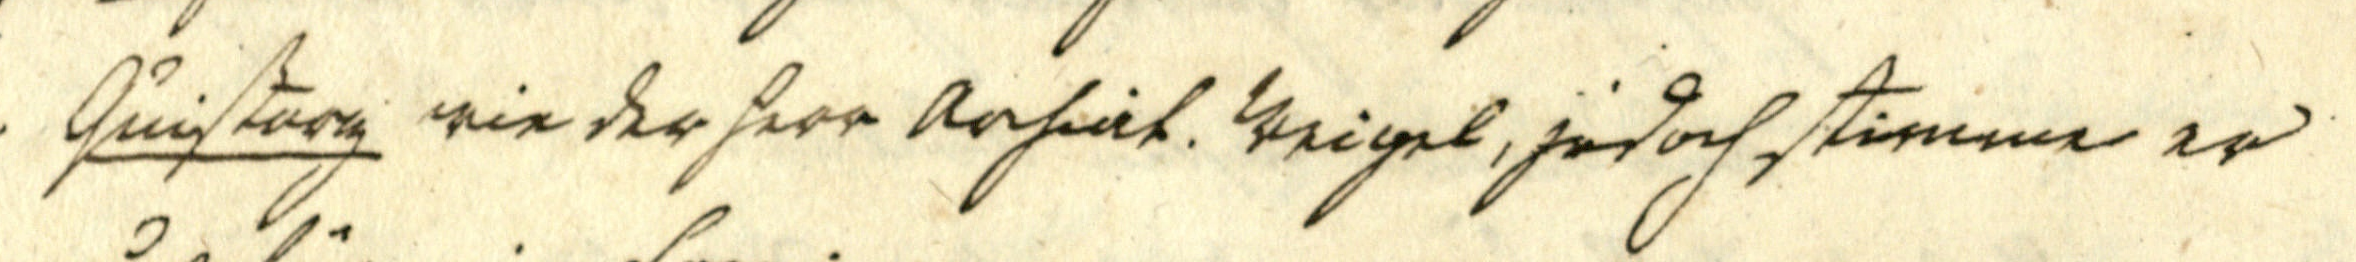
Quistorp wie der Herr Archiat. Weigel, jedoch stimme er
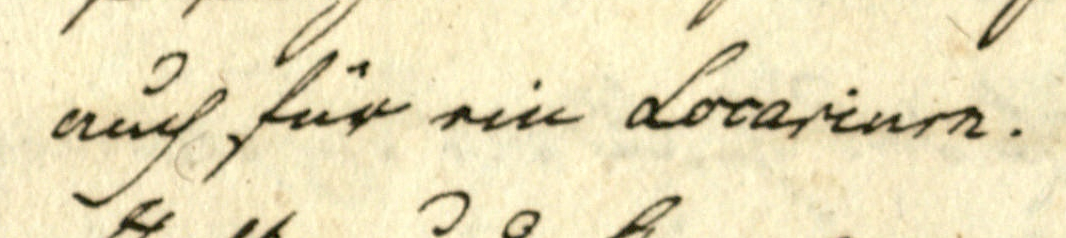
auch für ein Locarium.
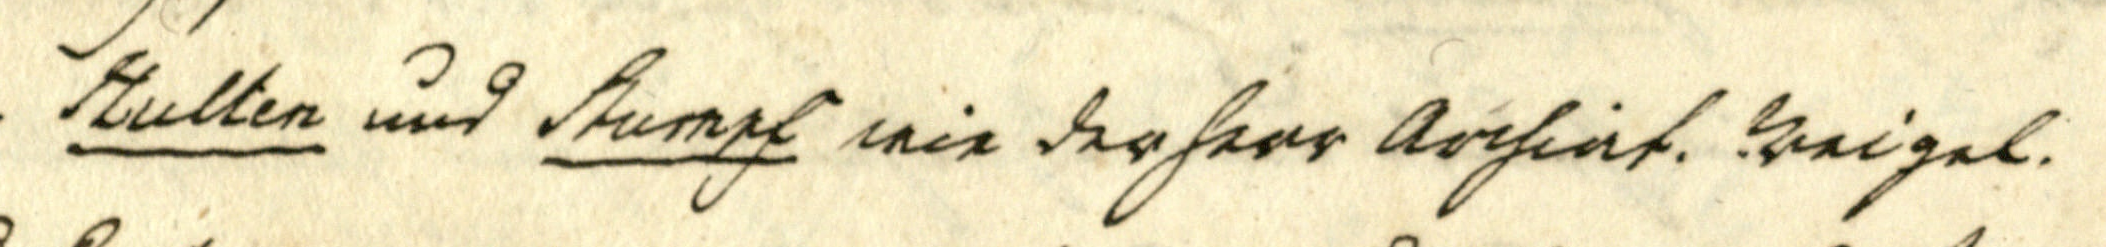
Hultén und Stumpf wie der Herr Archiat. Weigel.
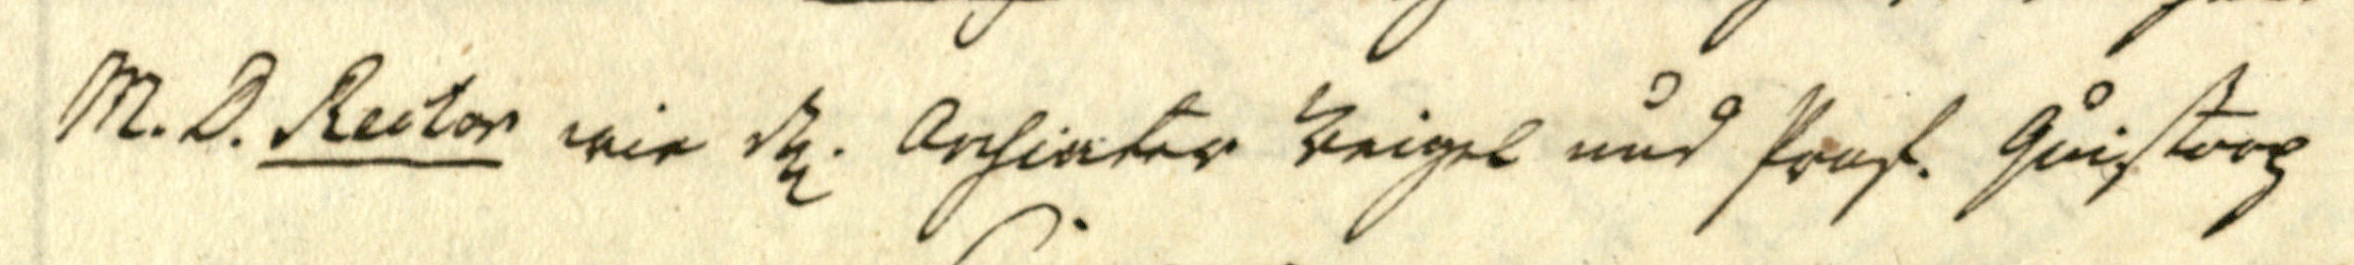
M. D. Rector wie dh. Archiater Weigel und Prof. Quistorp
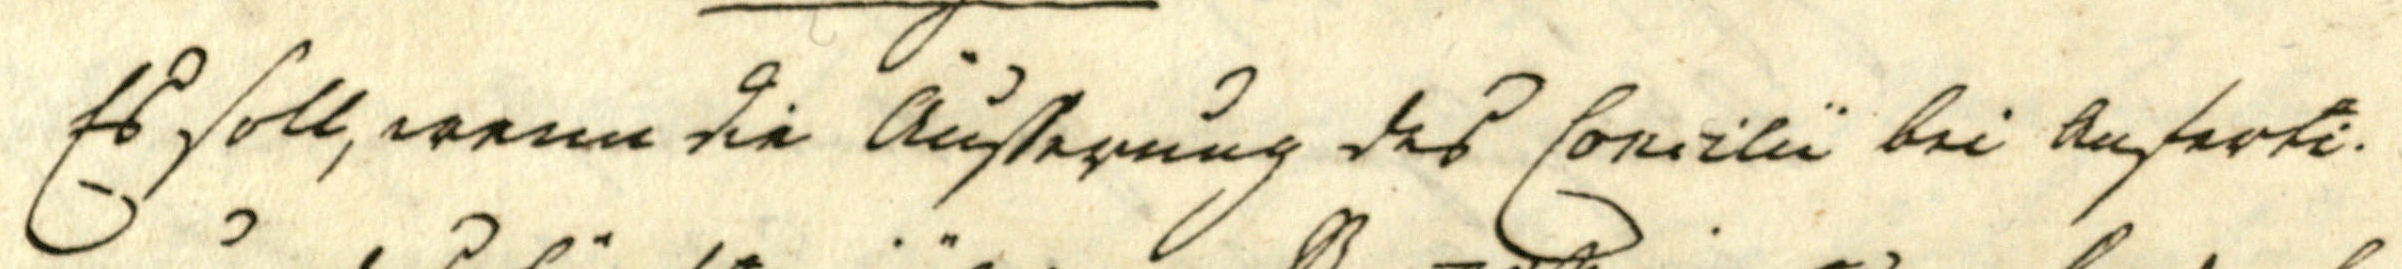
Es soll, wenn die Äusserung des Concilii bei Anferti¬
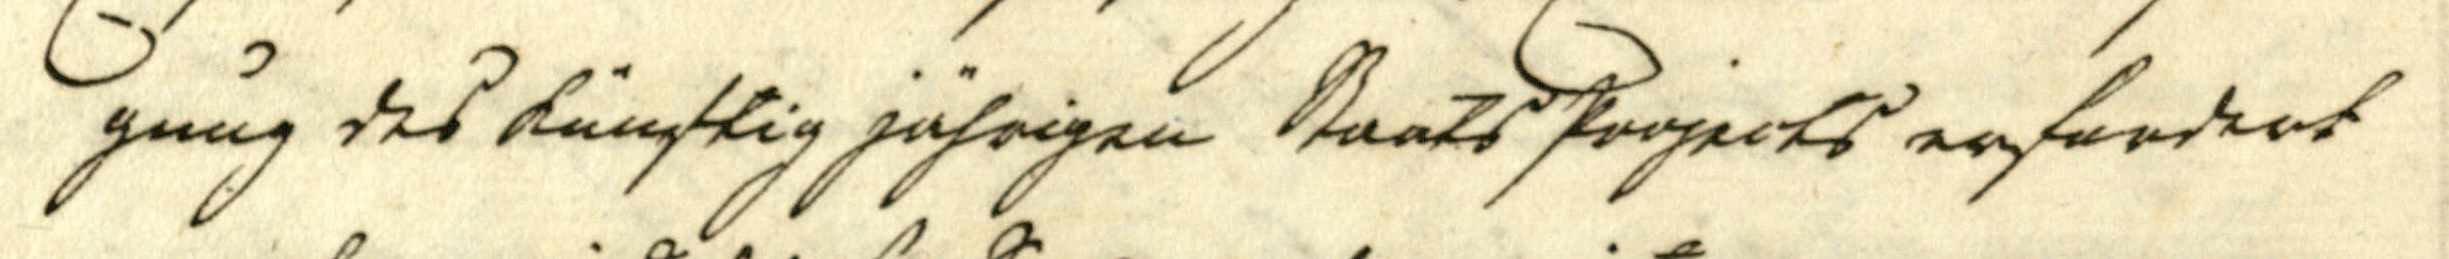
gung des künftig jährigen Staats projects erfordert
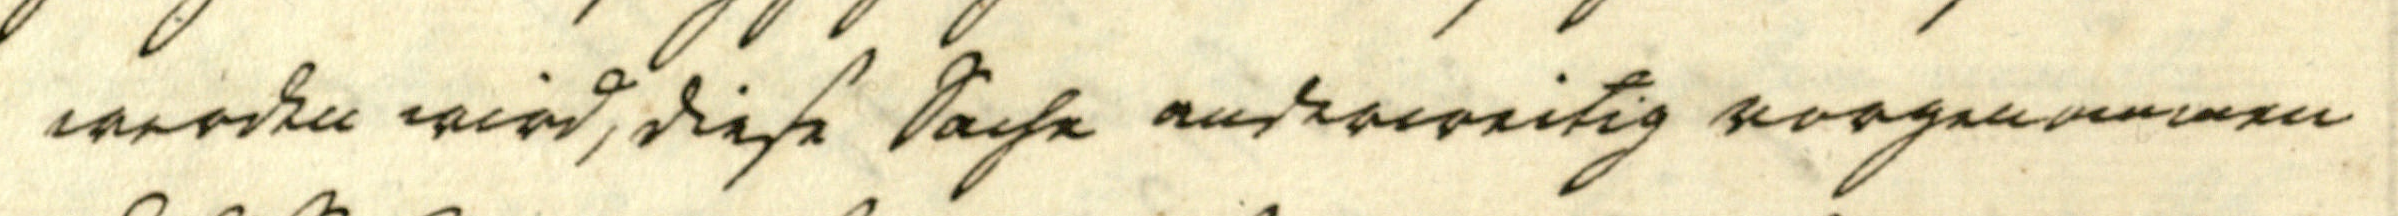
werden wird, diese Sache anderweitig vorgenommen
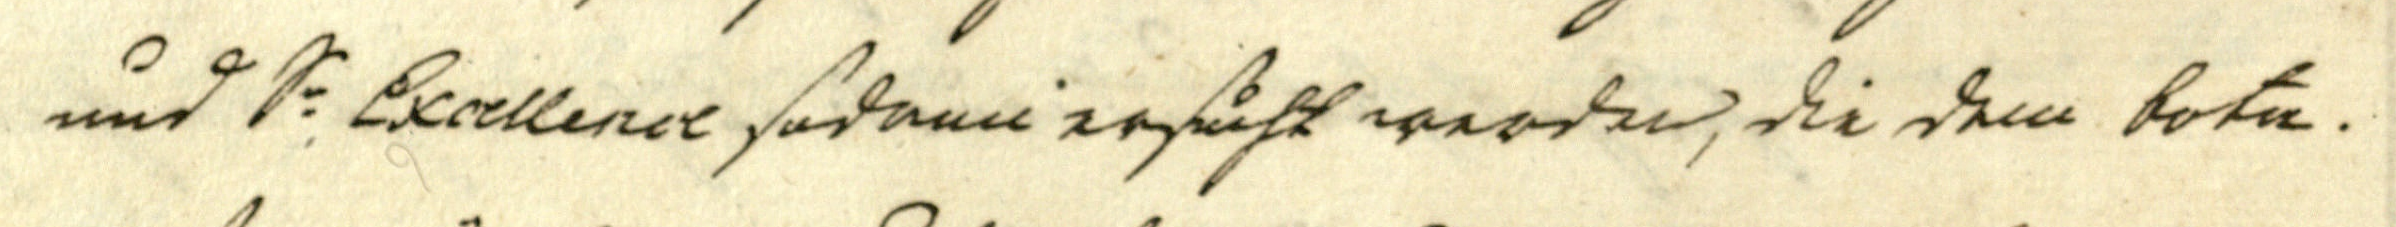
und Sr Excellence sodann ersucht werden, die dem bota¬
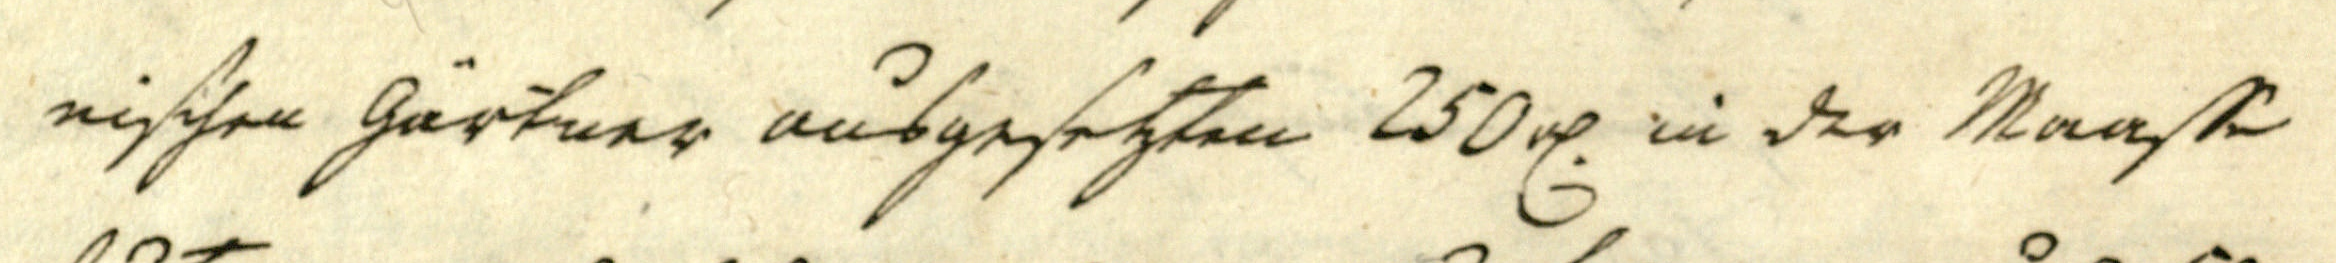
nischen Gärtner ausgesetzten 250 l. in der Maasse
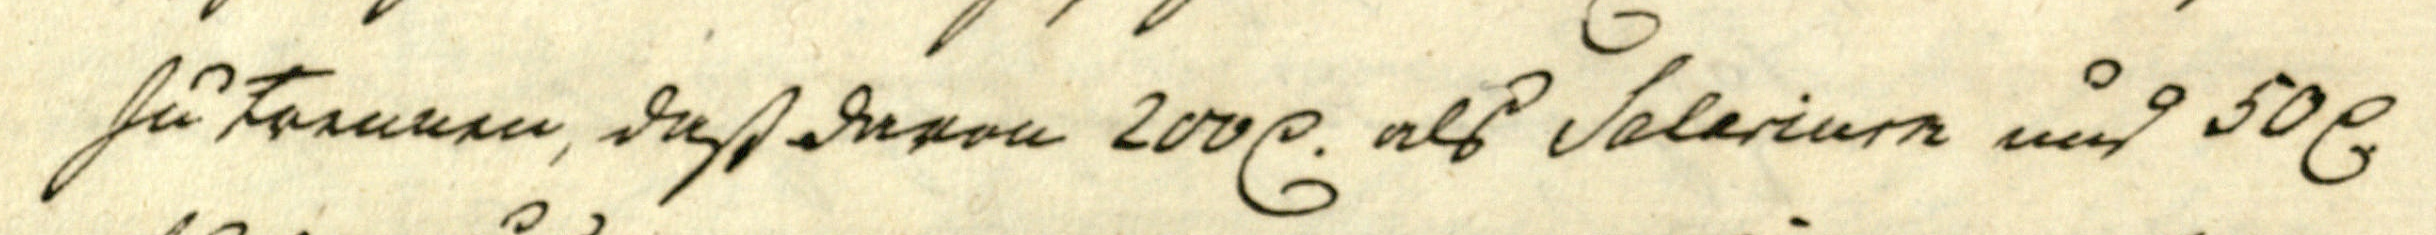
zu trennen, daß davon 200 l. als Salarium und 50 l.
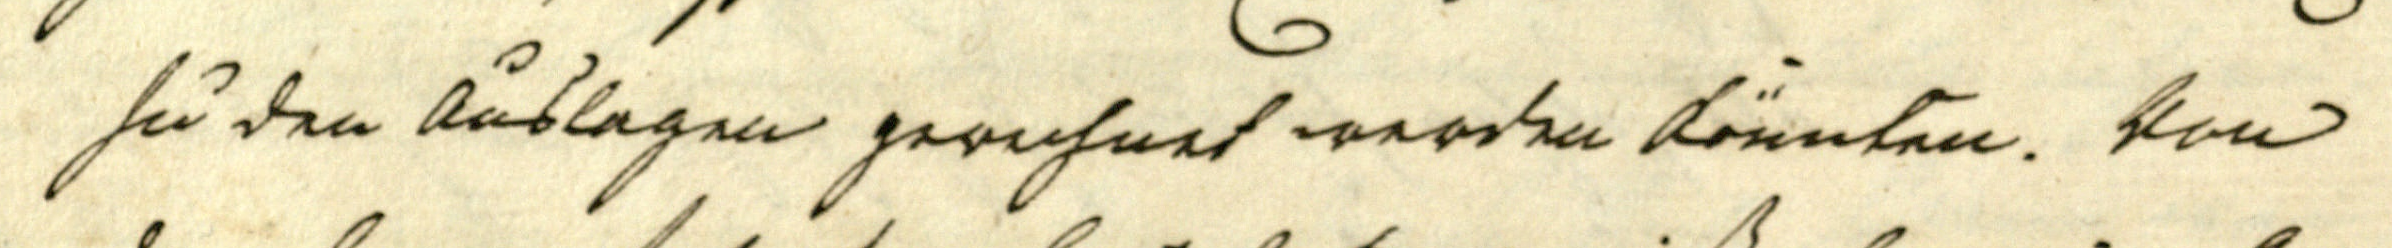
zu den Auslagen gerechnet werden könnten. Von
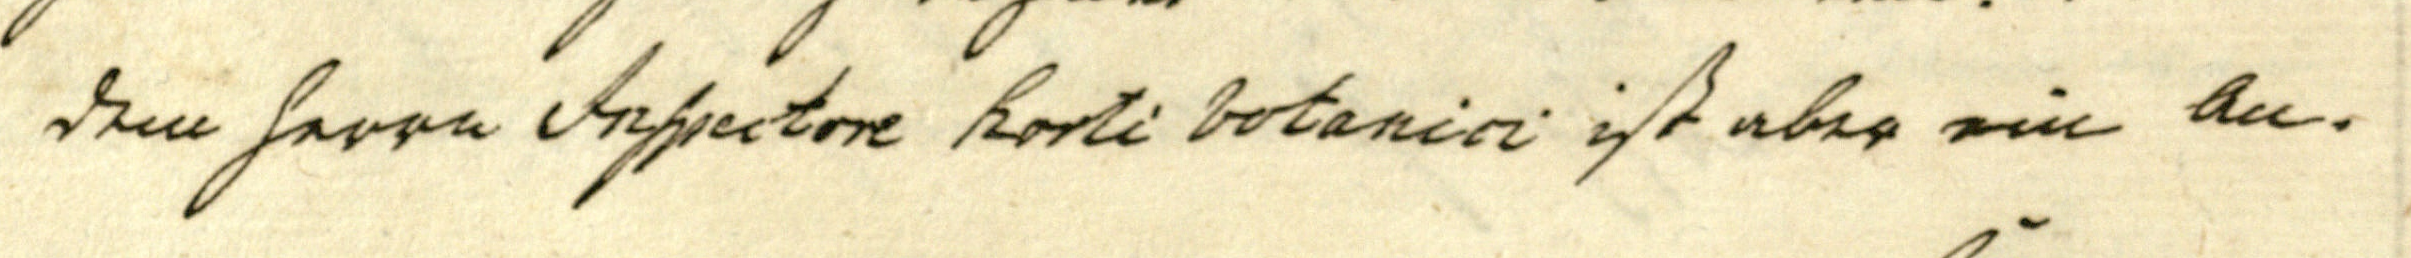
dem Herrn Inspectore horti botanici ist aber ein An¬
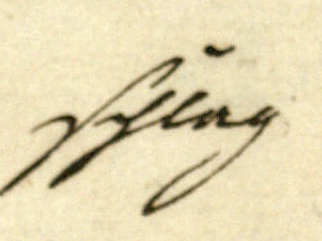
schlag
